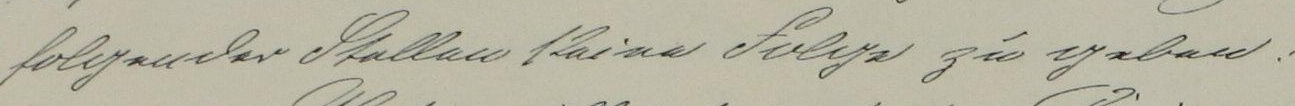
folgender Stellen keine Folge zu geben:
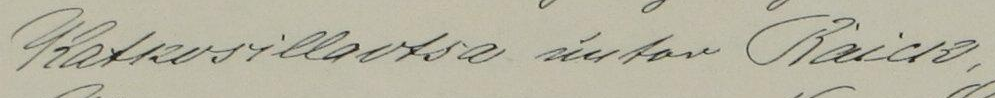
Katkosillaotsa unter Raick,
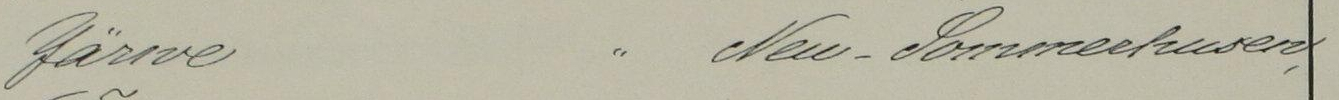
Järwe " Neu-Sommerhusen,
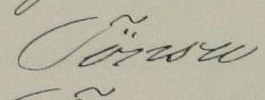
Tönsu
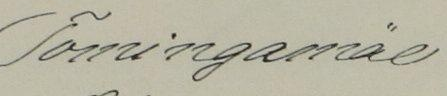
Tomingamäe
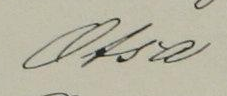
Otsa
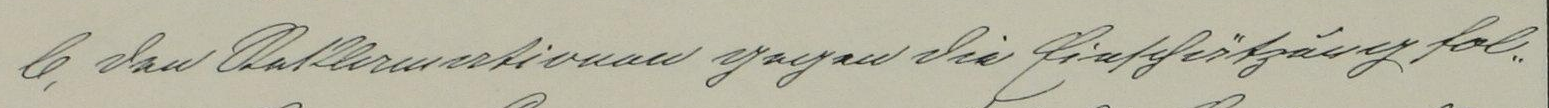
b. den Reklamationen gegen die Einschätzung fol-
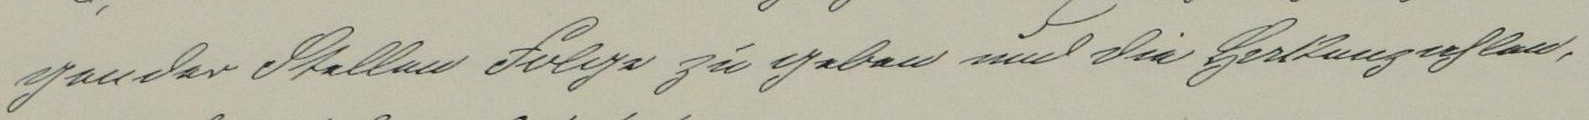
gender Stellen Folge zu geben und die Hakenzahlen,
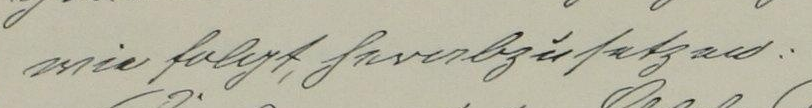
wie folgt, herabzusetzen:
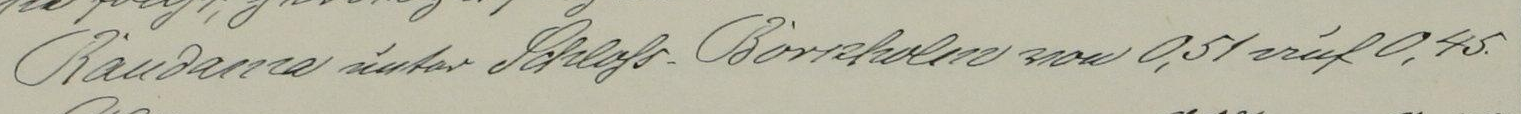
Raudama unter Schloss-Borkholm von 0,51 auf 0,45
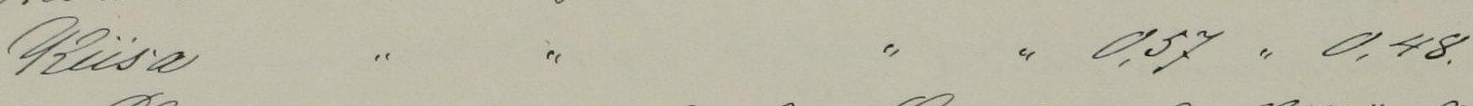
Kiisa " " " " 0,57 " 0,48
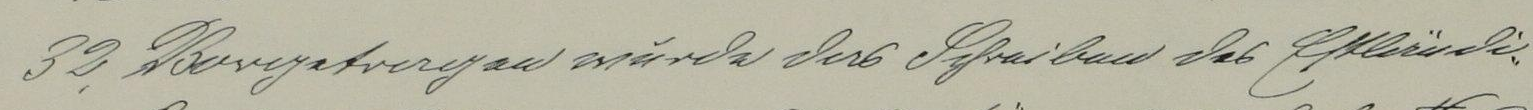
32. Vorgetragen wurde das Schreiben des Estländi-
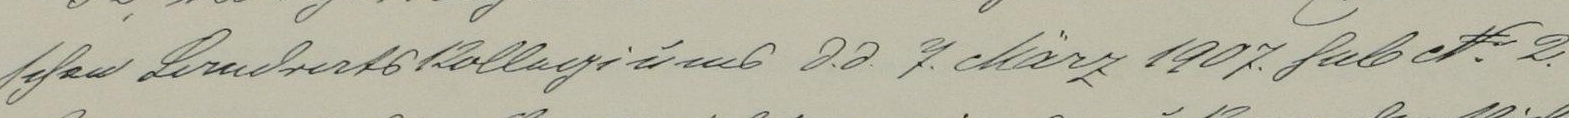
schen Landratskollegiums d.d. 7. März 1907. sub No. 2.
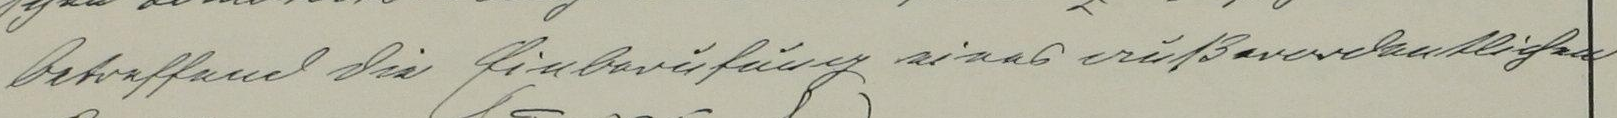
betreffend die Einberufung eines außerordentlichen
